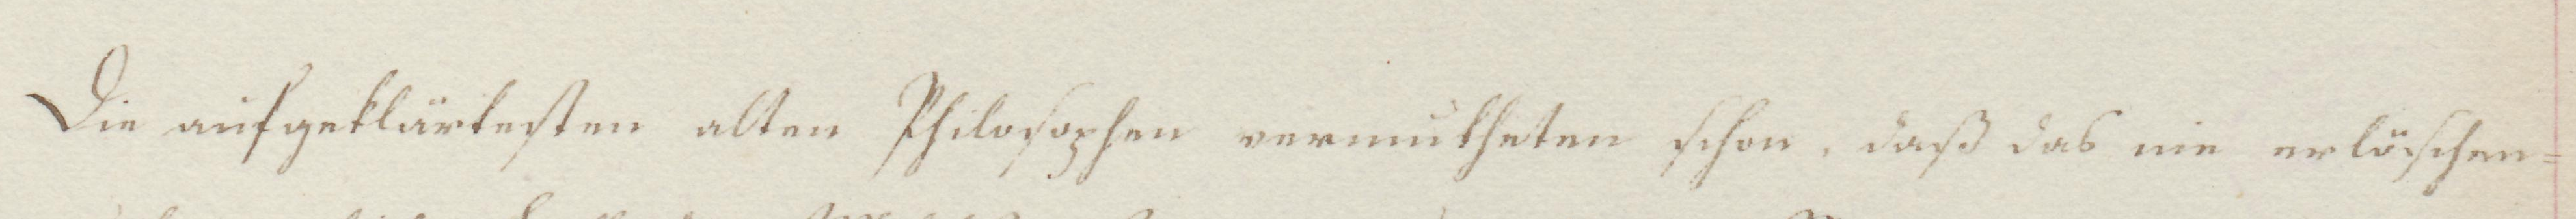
Die aufgeklärtesten alten Philosophen vermutheten schon, daß das nie erlöschen-
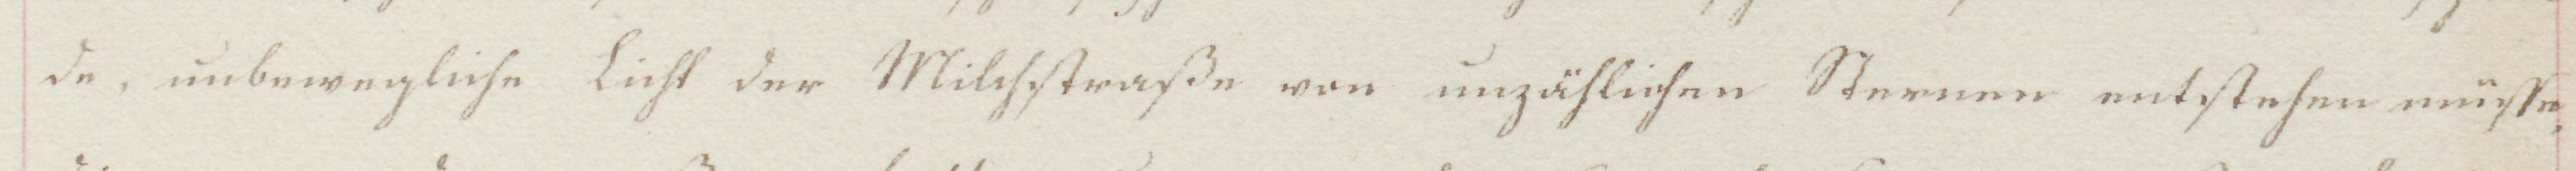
de, unbewegliche Licht der Milchstraße von unzählichgen Sternen entstehen müsse,
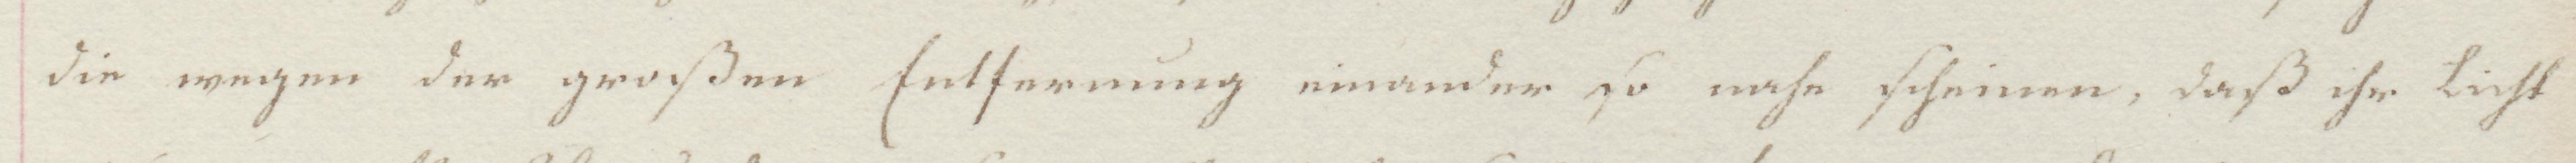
die wegen der großen Entfernung einander so nahe scheinen, daß ihr Licht
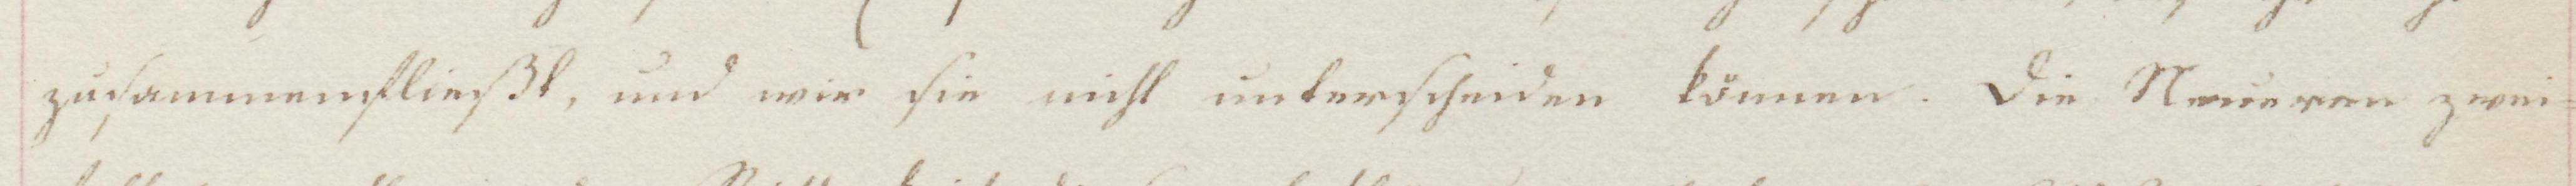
zusammenfließt, und wir sie nicht unterscheiden können. Die Neueren zwei-
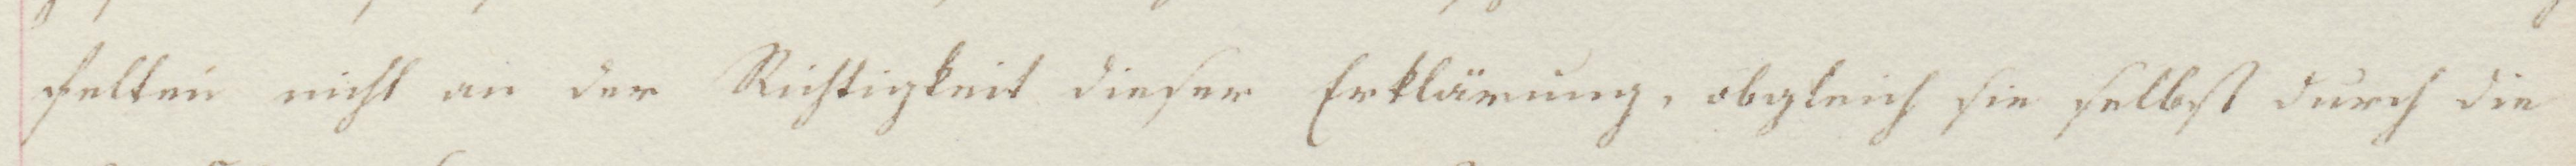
felten nicht an der Richtigkeit dieser Erklärung, obgleich sie selbst durch die
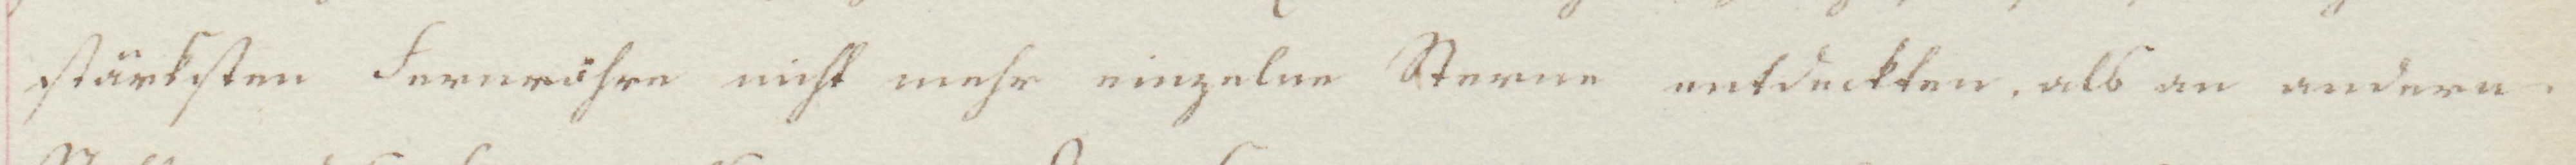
stärksten Fernröhre nicht mehr einzelne Sterne entdeckten, als an andern
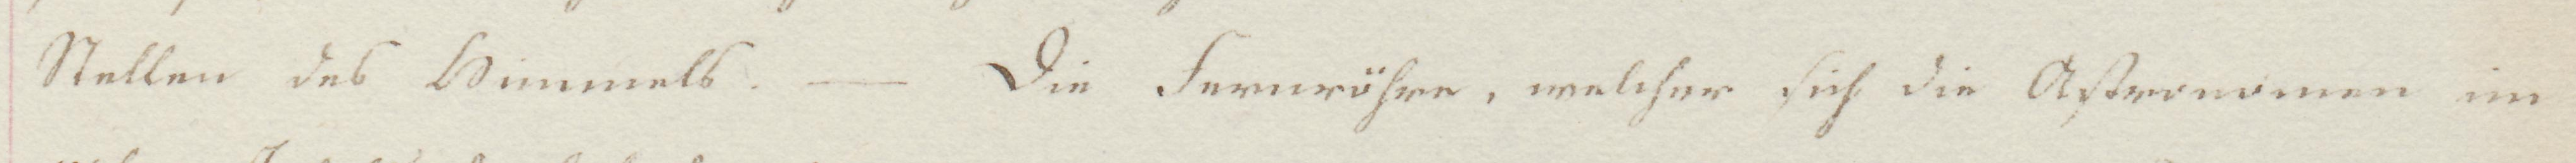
Stellen des Himmels. – Die Fernröhre, welcher sich die Astronomen im
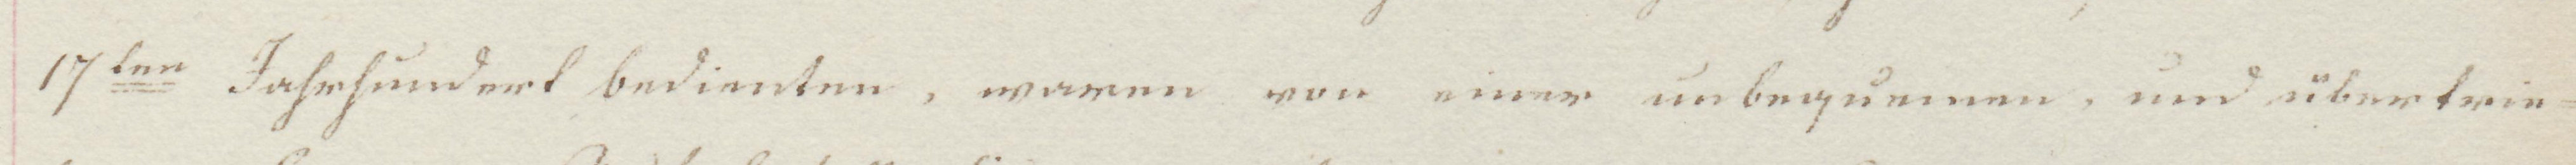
17ten Jahrhundert bedienten, waren von einer unbequemen, und übertrie-
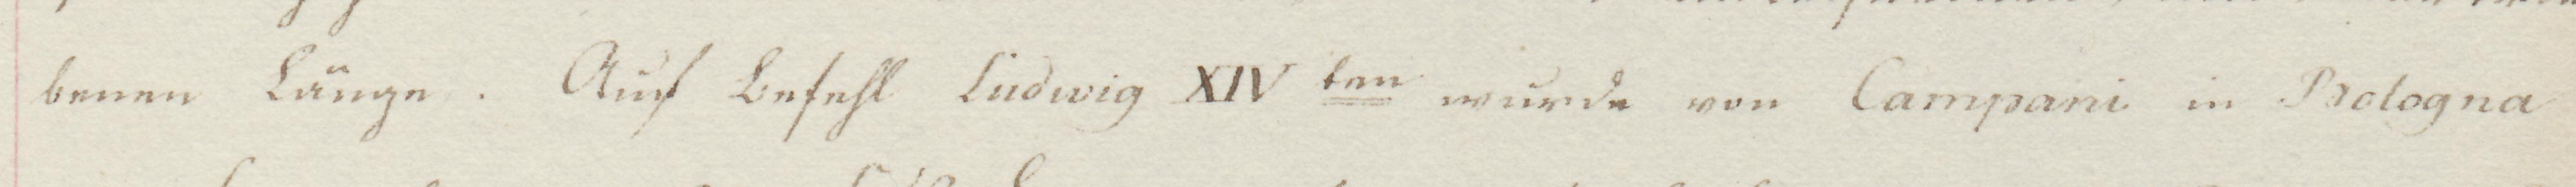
benen Länge. Auf Befehl Ludwig XIVten wurde von Campani in Bologna
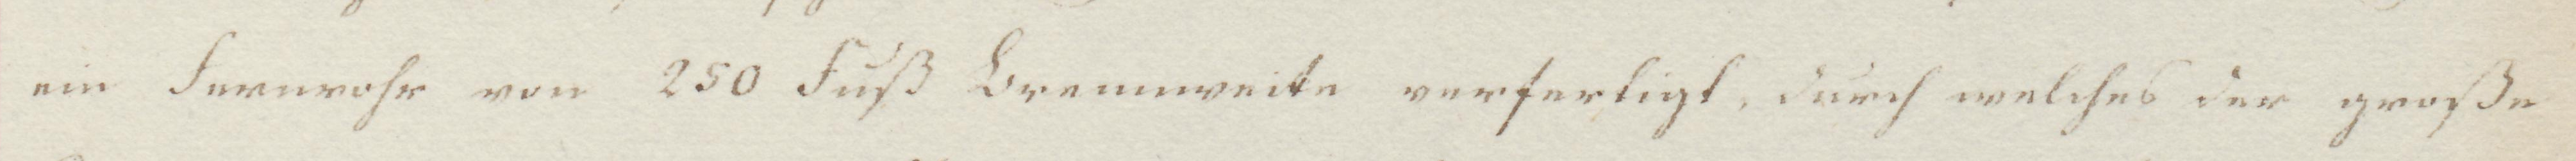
ein Fernrohr von 250 Fuß Brennweite verfertigt, durch welches der große
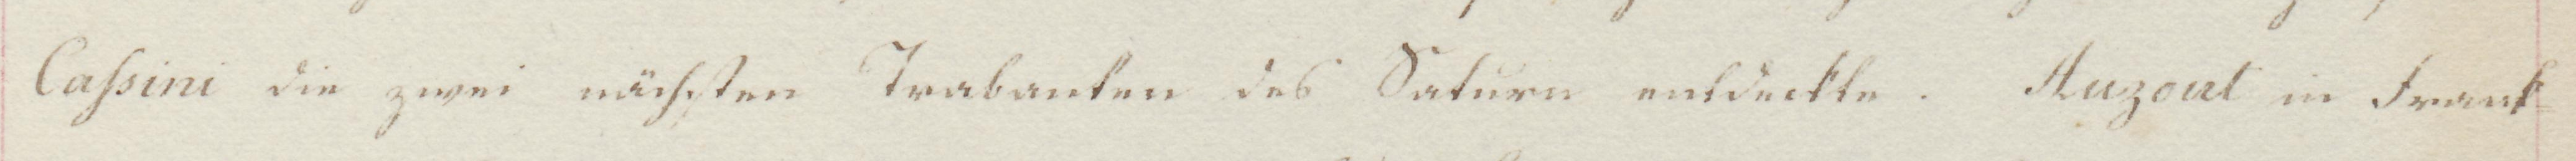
Cassini die zwei nächsten Trabanten des Saturn entdeckte. Auzout in Frank-
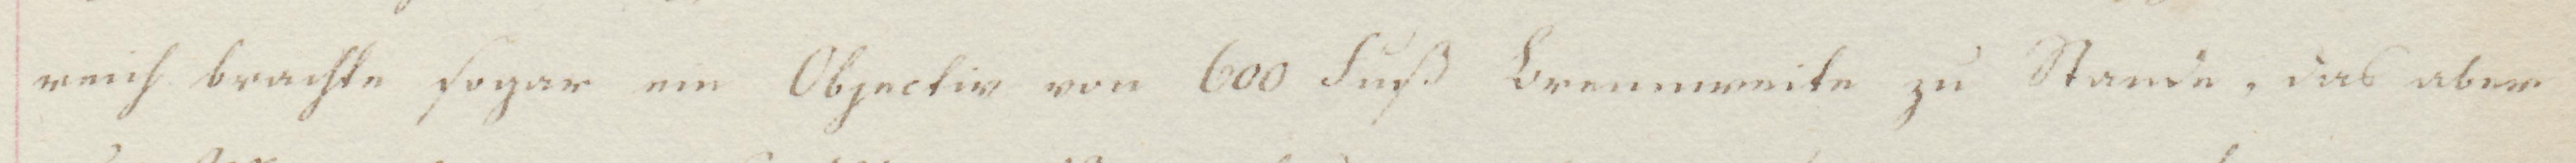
reich brachte sogar ein Objectiv von 600 Fuß Brennweite zu Stande, das aber
